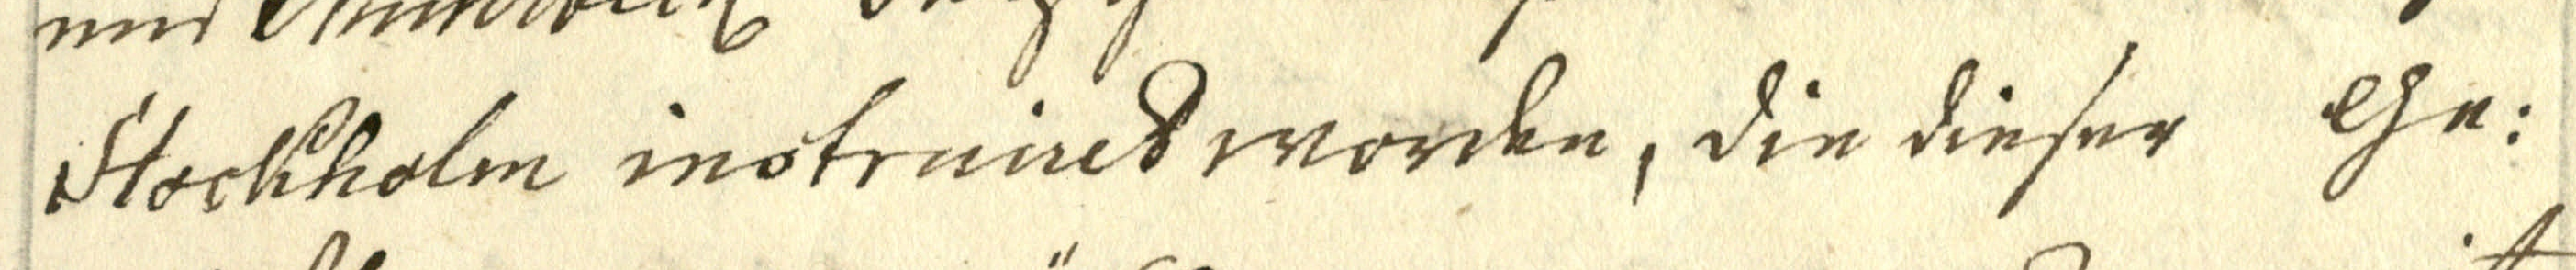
Stockholm instruiret worden, die dieser Ge¬
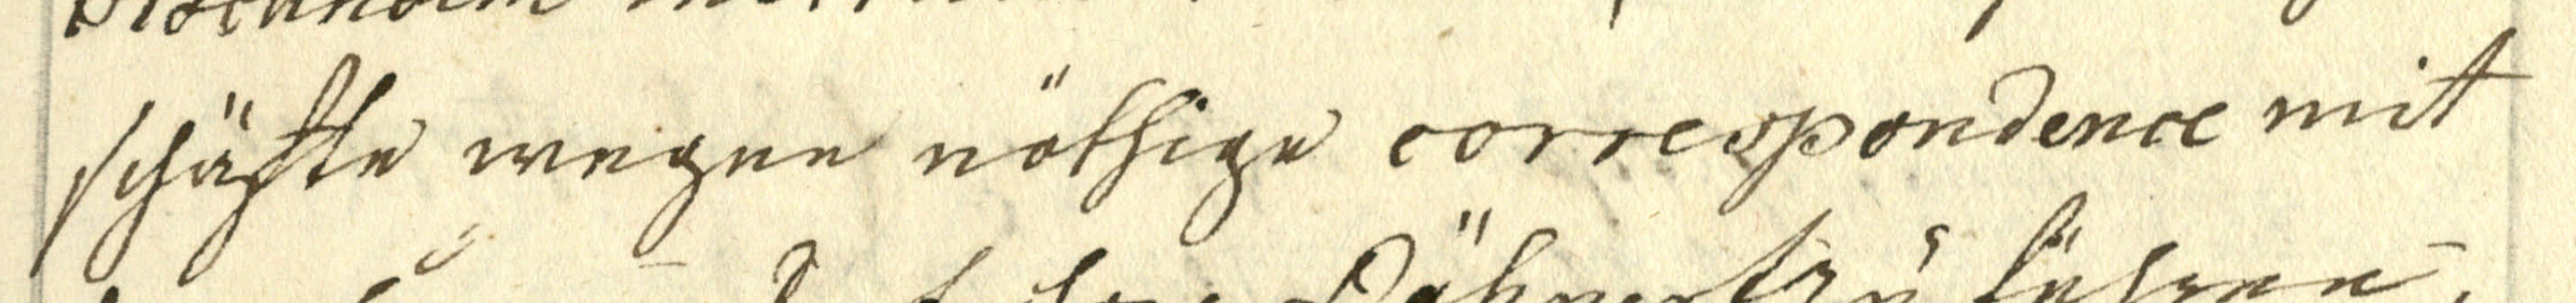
schäfte wegen nöthige correspondence mit
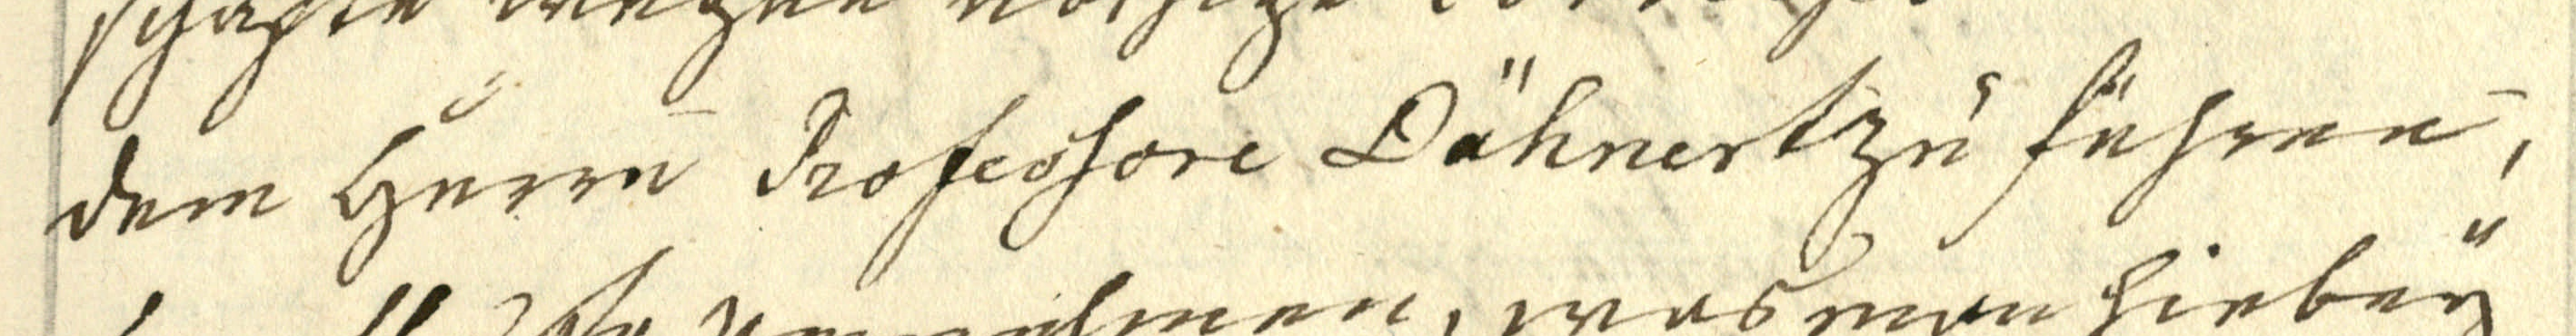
dem Herrn Professore Dähnert zu führen,
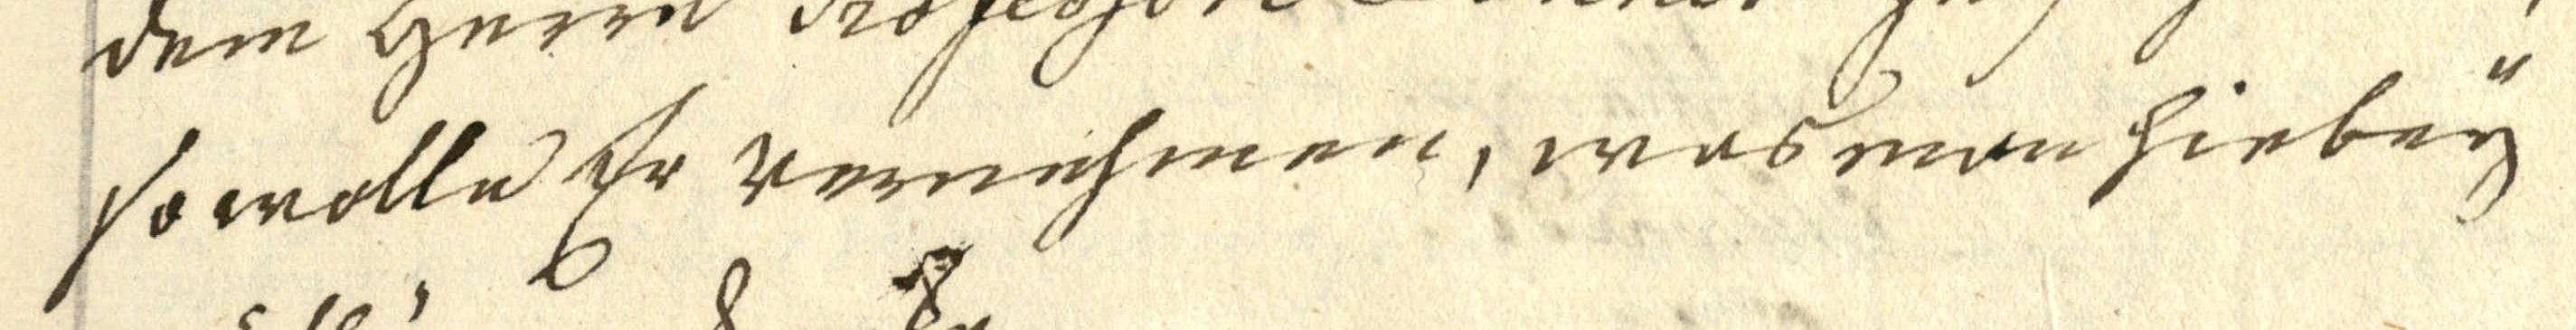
so wolle Er vernehmen, was man hiebeÿ
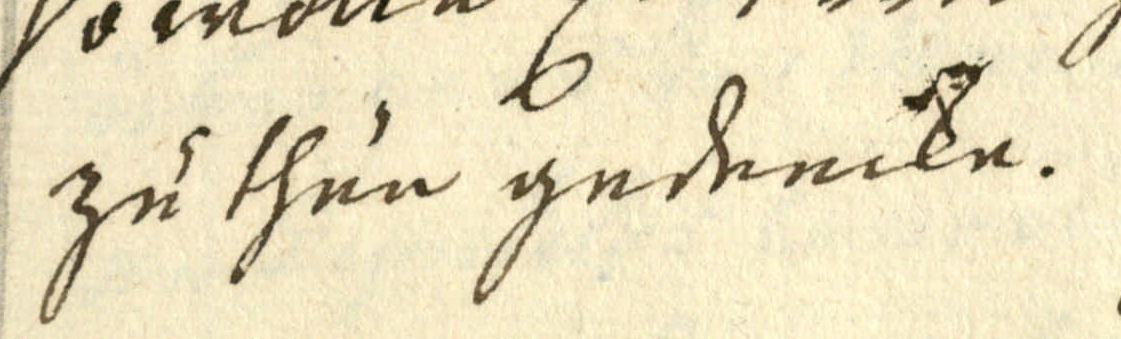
zu thun gedencke
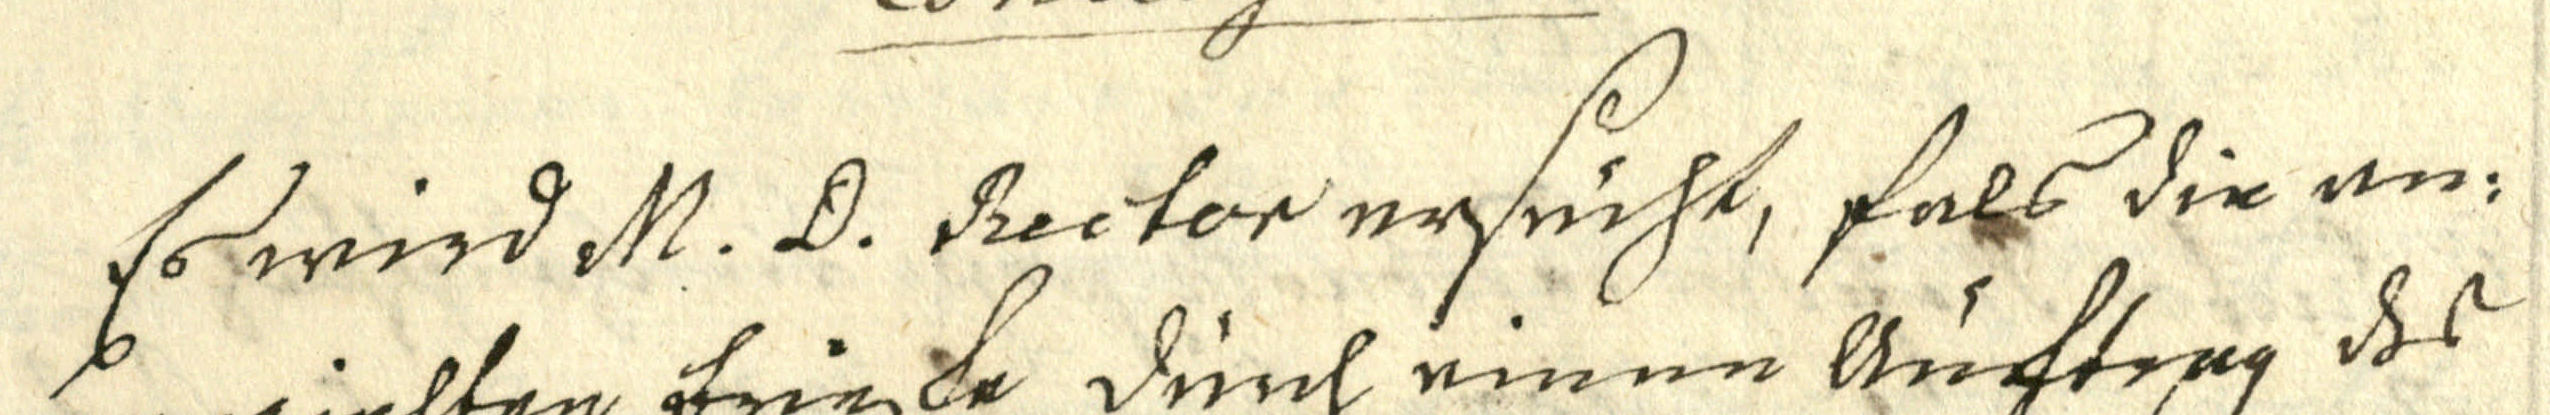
Es wird M. D. Rector ersucht, fals die an¬
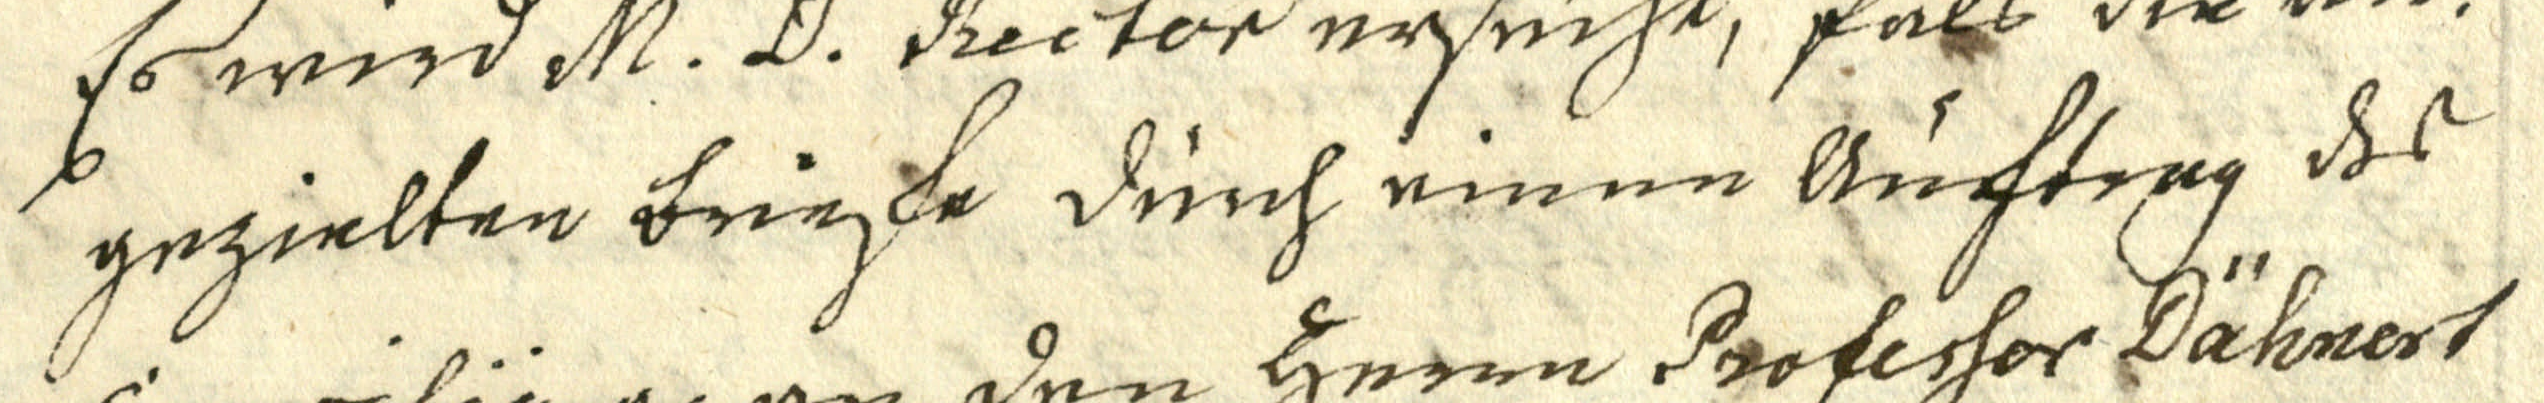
gezielten Briefe durch einen Auftrag des
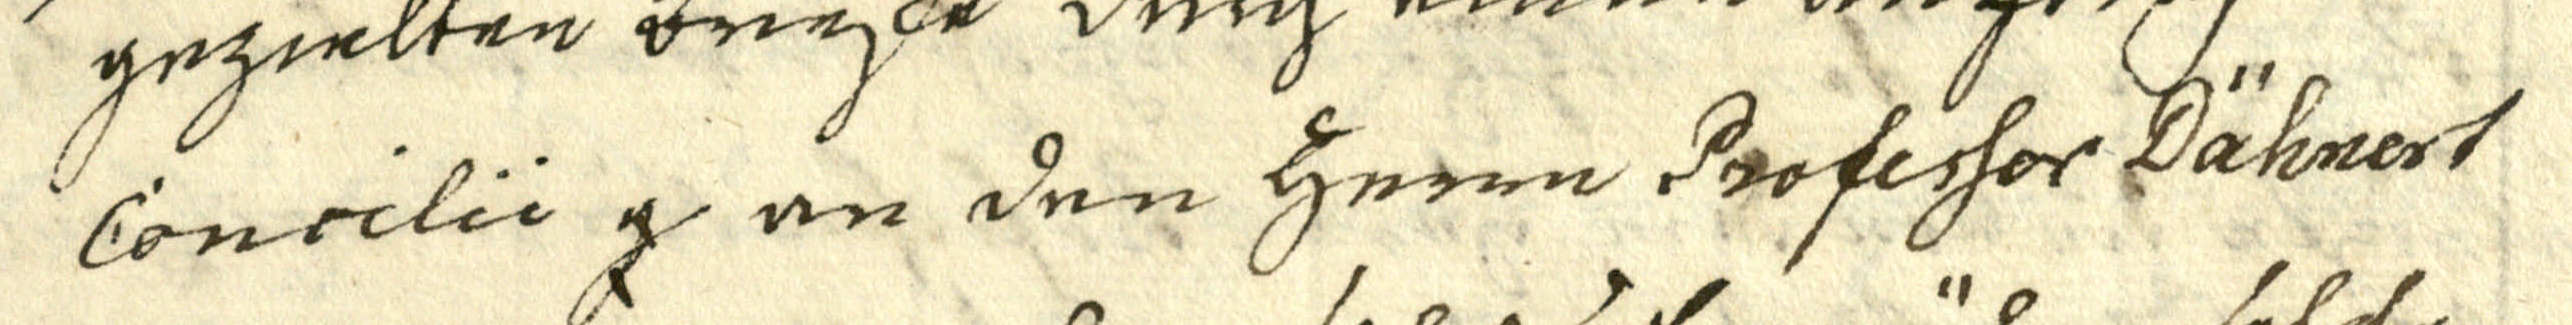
Concilii g an den Herrn Professor Dähnert
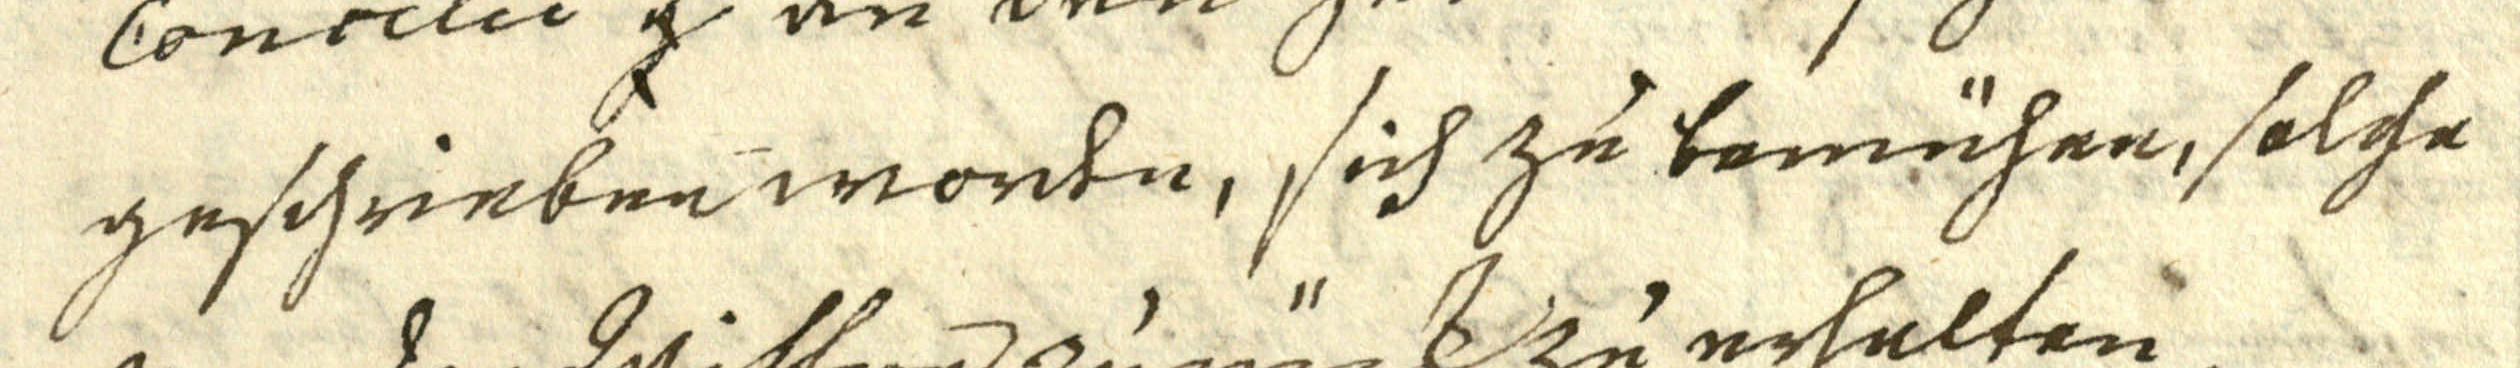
geschrieben worden, sich zu bemühen, solche
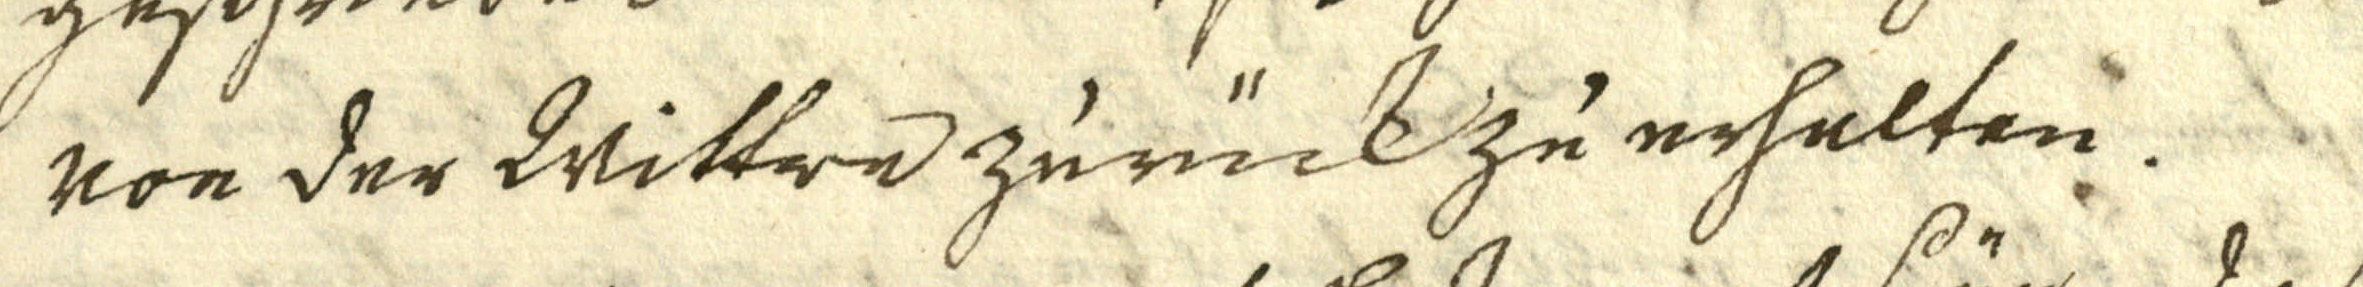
von der Wittwe zurück zu erhalten
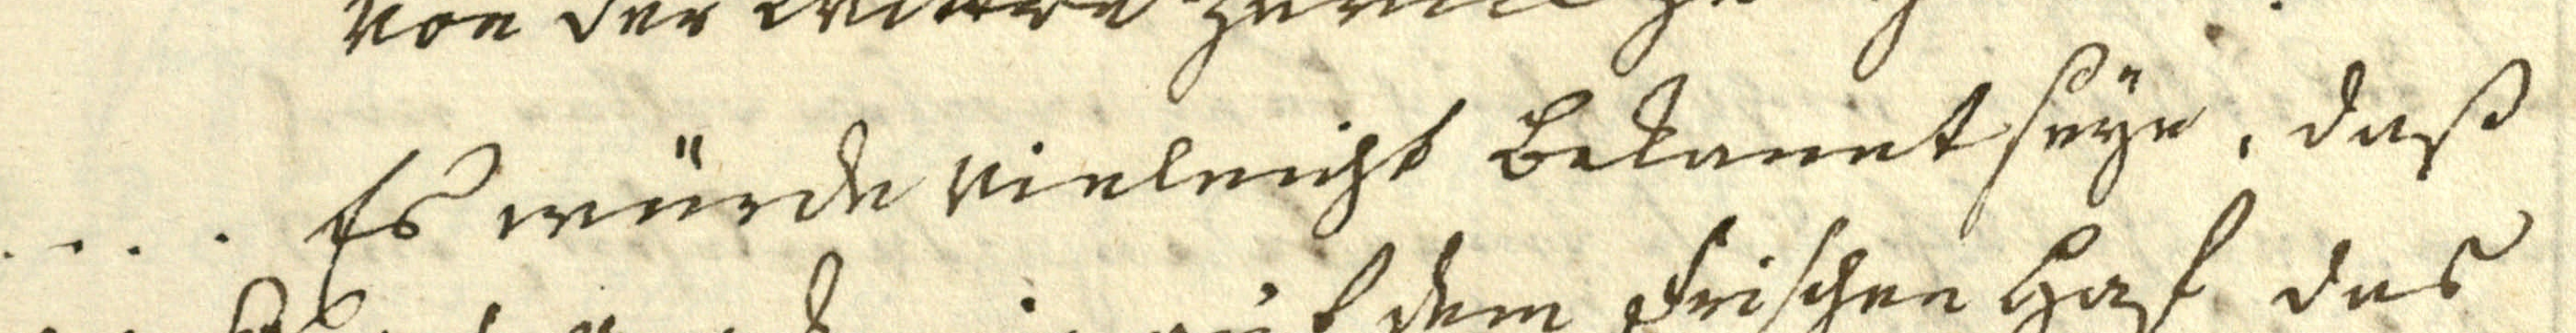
Es würde vieleicht bekannt seÿn, daß
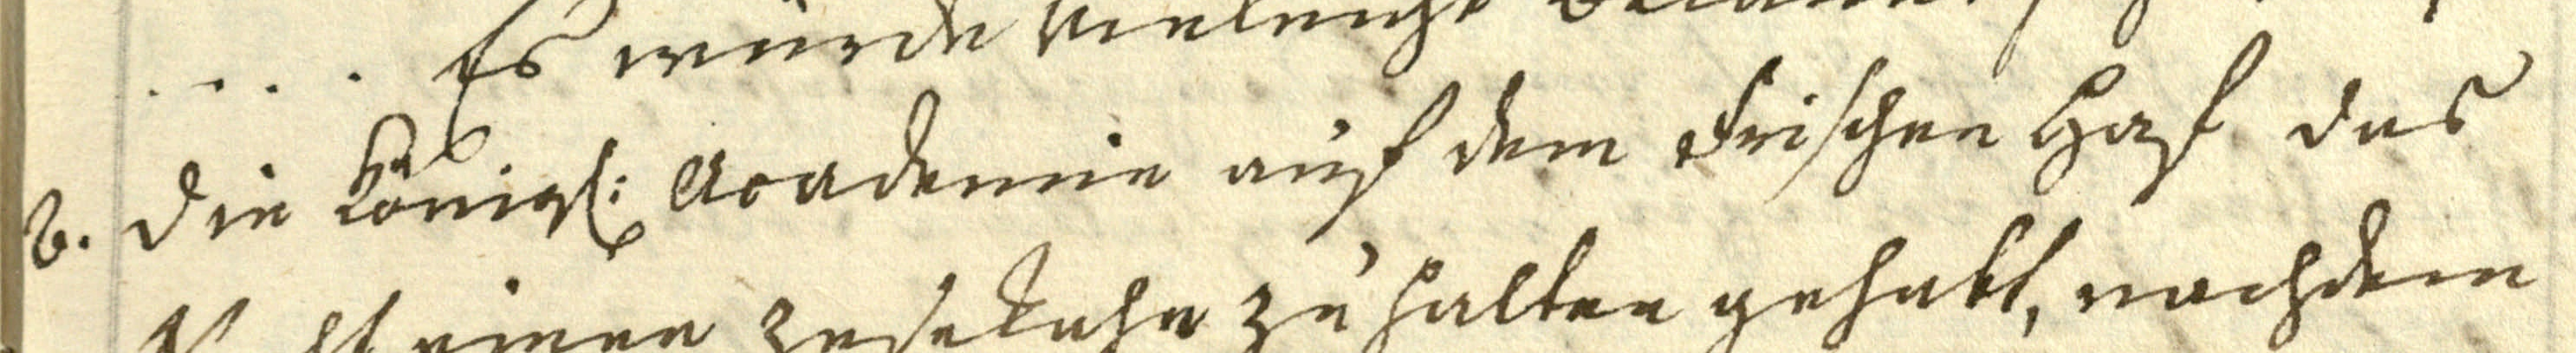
8. Die Königl. Academie auf dem Frischen Haf das
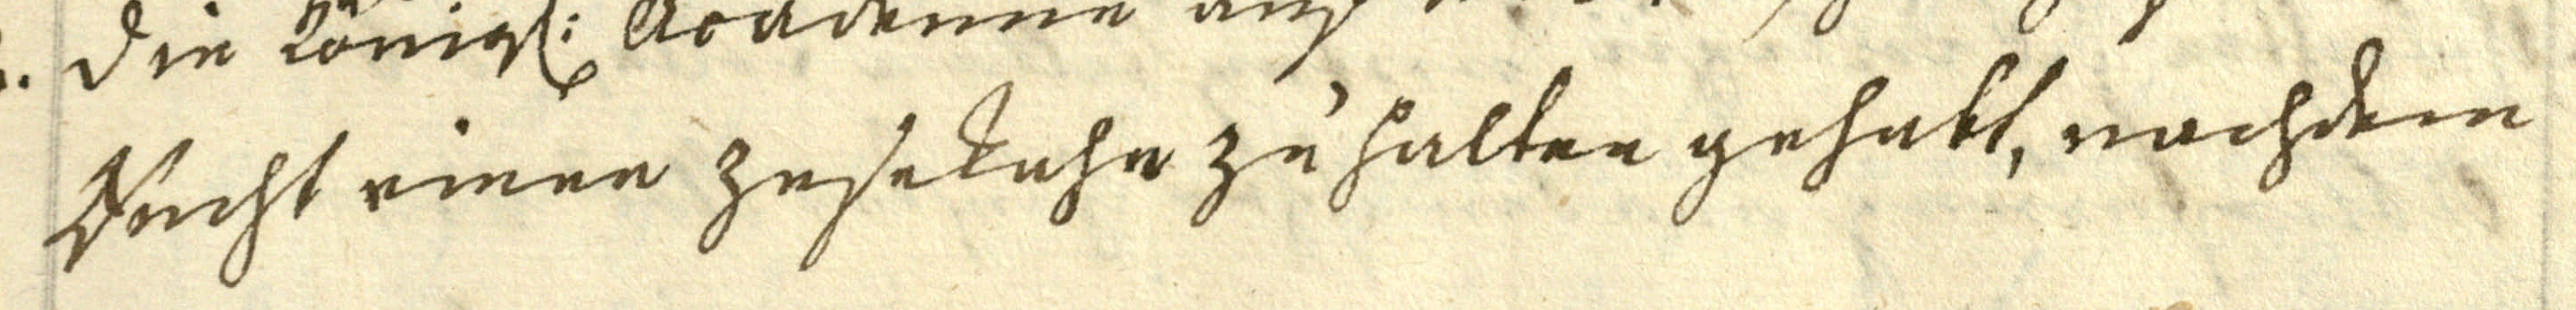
Recht einen Zesekahn zu halten gehabt, nachdem
